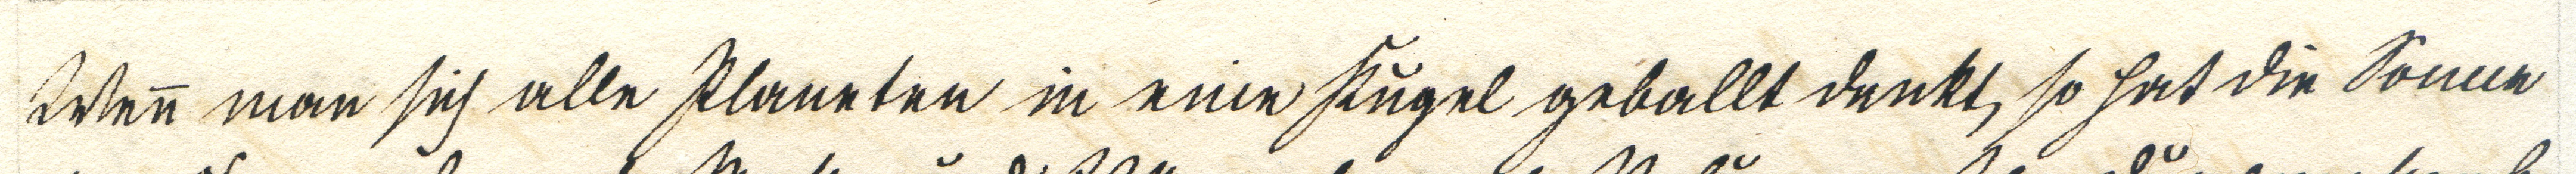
Weñ man sich alle Planeten in eine Kugel geballt denkt, so hat die Sonne
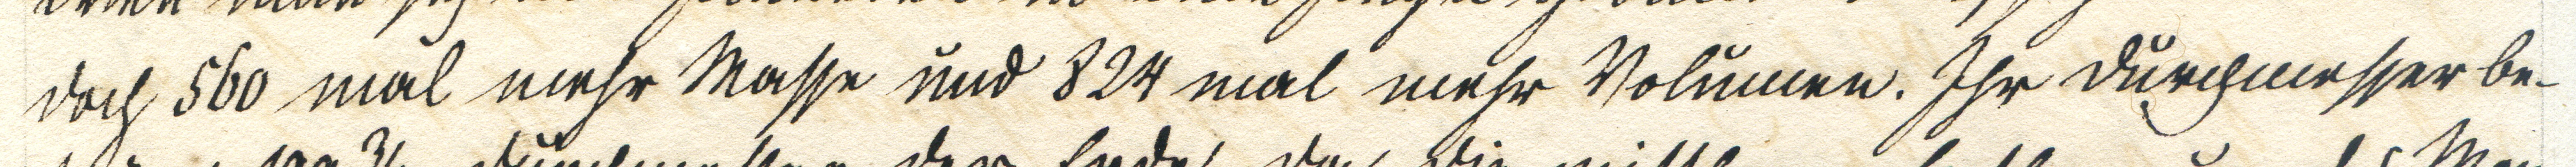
doch 560 mal mehr Masse und 824 mal mehr Volumen. Ihr Durchmesser be-
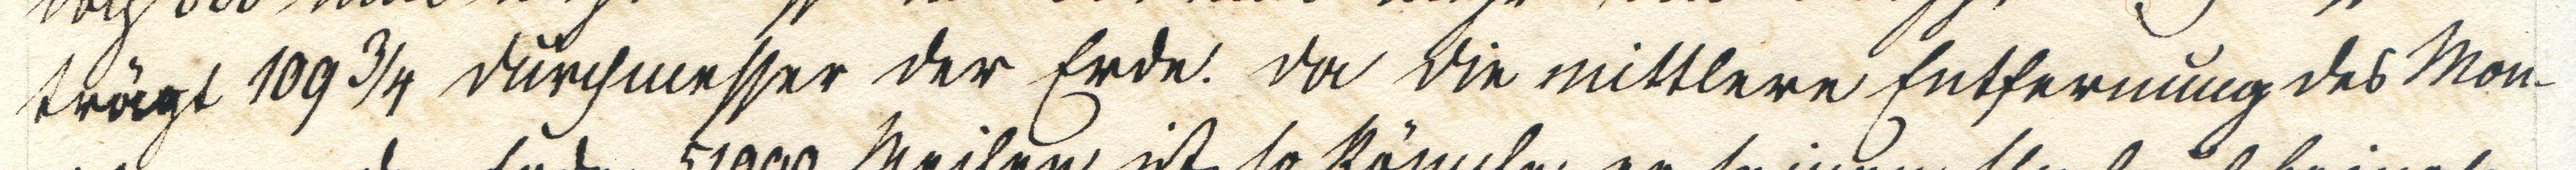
trägt 109¾ Durchmesser der Erde. Da die mittlere Entfernung des Mon-
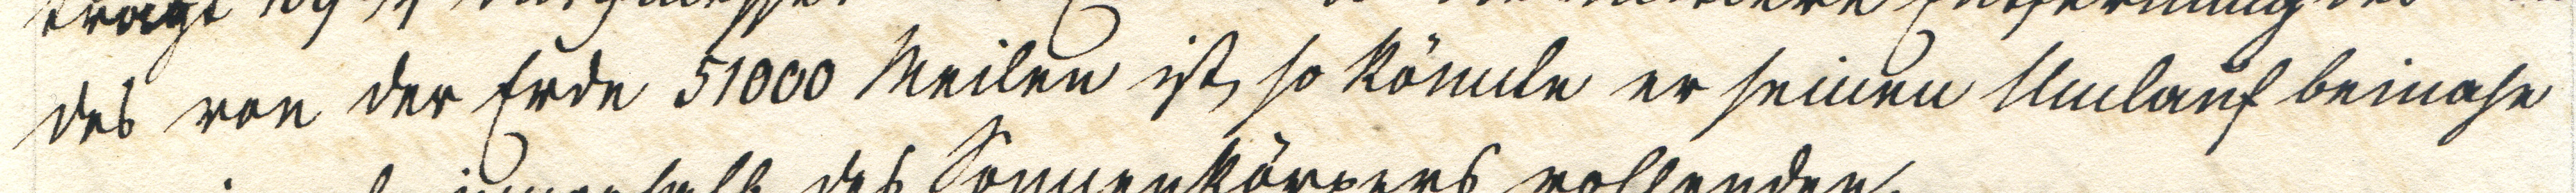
des von der Erde 51000 Meilen ist, so könnte er seinen Umlauf beinahe
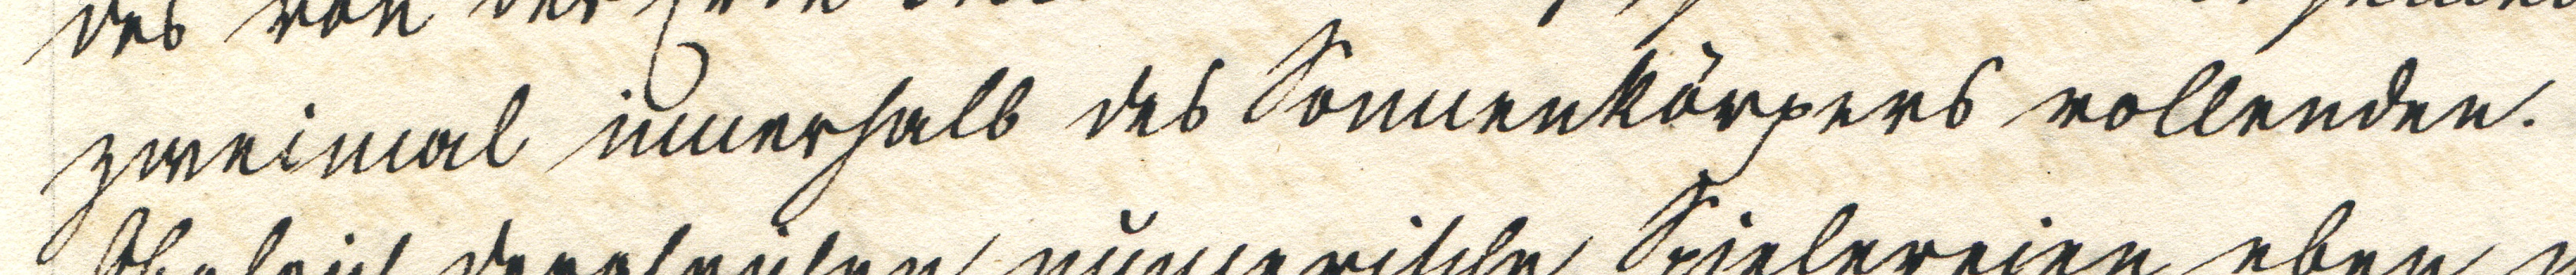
zweimal innerhalb des Sonnenkörpers vollenden.
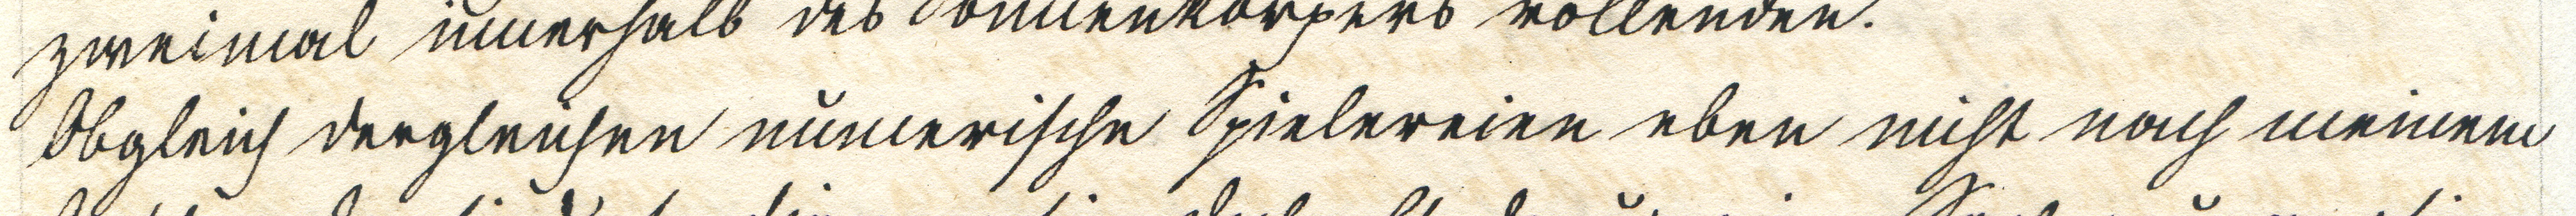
Obgleich dergleichen numerische Spielereien eben nicht nach meinem
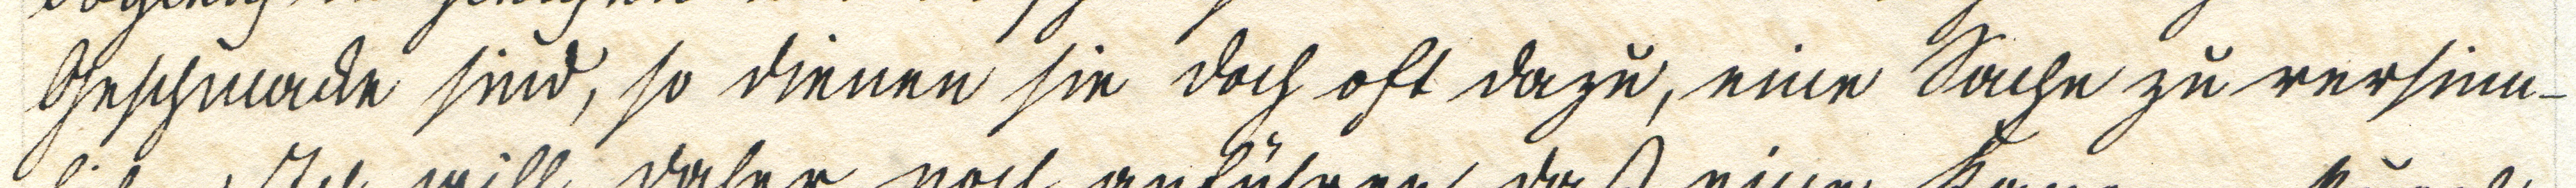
Geschmacke sind, so dienen sie doch oft dazu, eine Sache zu versinn-
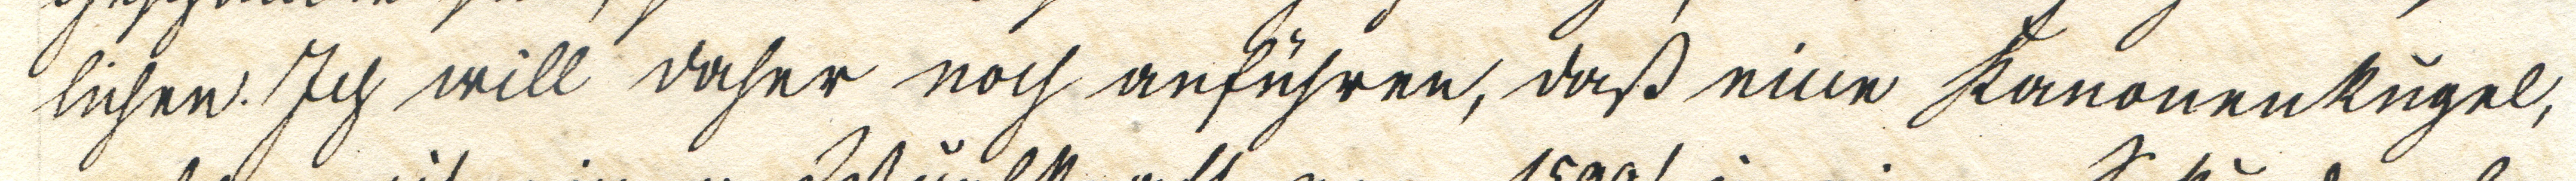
lichen. Ich will daher noch anführen, daß eine Kanonenkugel,
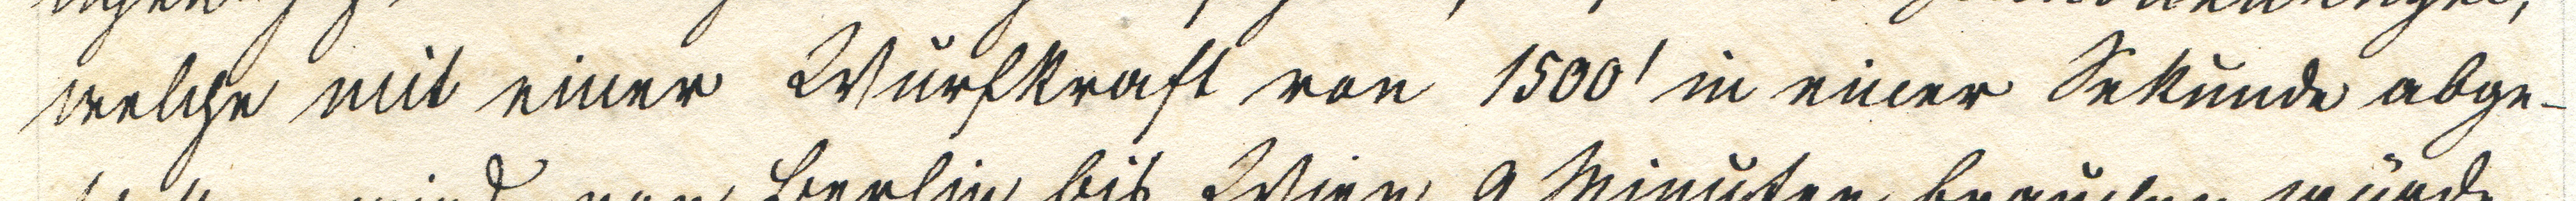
welche mit einer Wurfkraft von 1500′ in einer Sekunde abge-
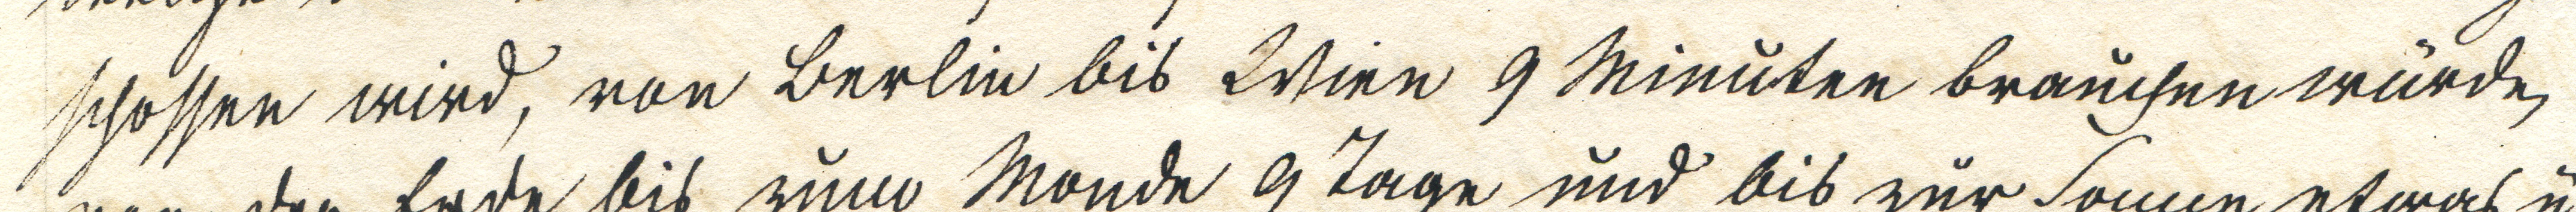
schossen wird, von Berlin bis Wien 9 Minuten brauchen würde,
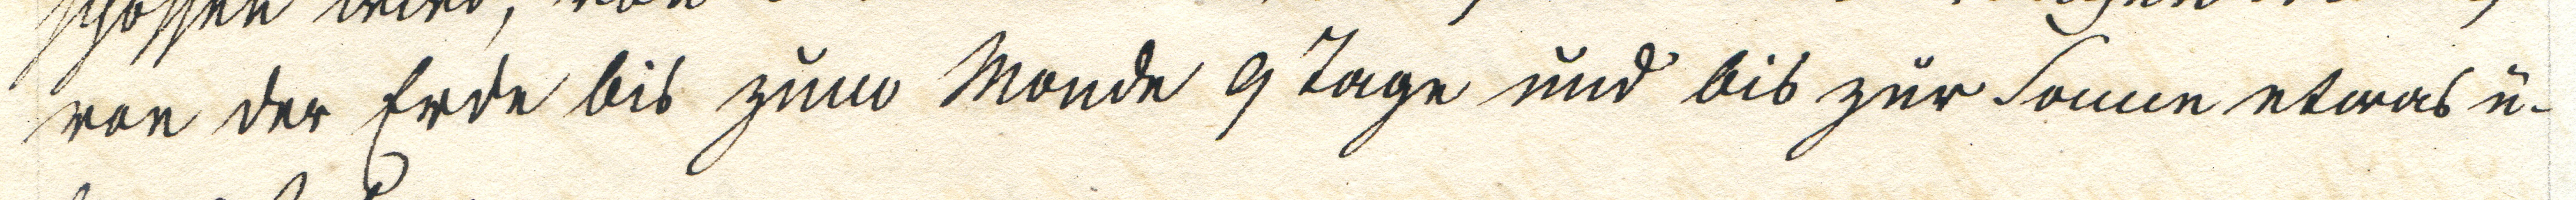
von der Erde bis zum Monde 9 Tage, und bis zur Sonne etwas ü-
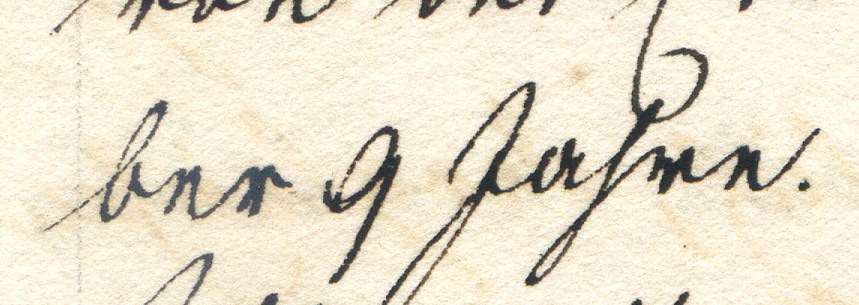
ber 9 Jahre.
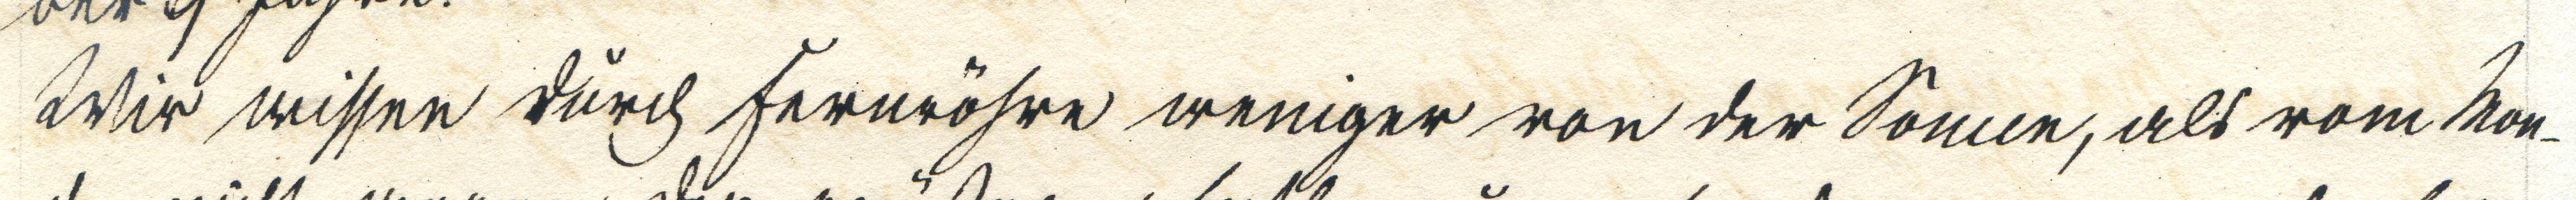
Wir wissen durch Fernröhre weniger von der Sonne, als vom Mon-
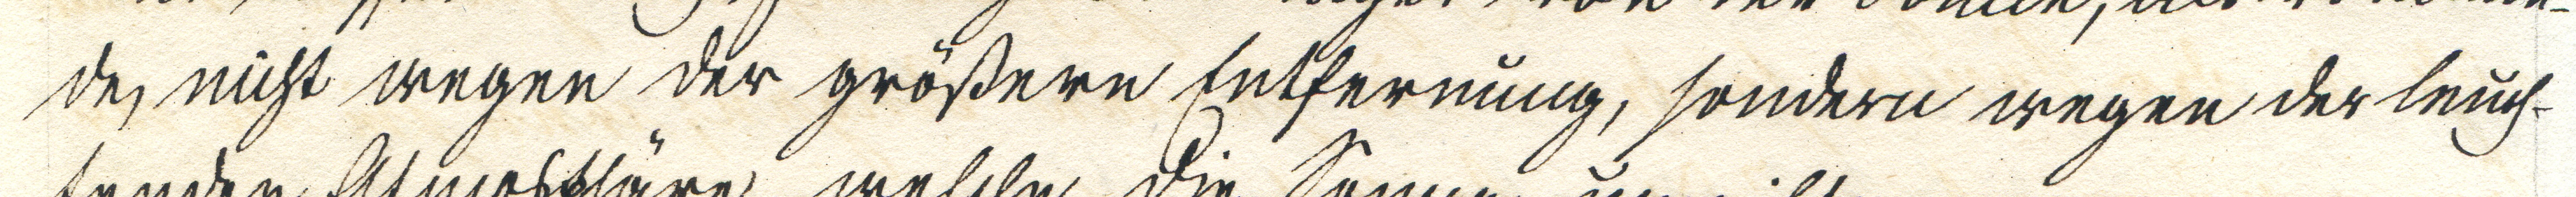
de, nicht wegen der größern Entfernung, sondern wegen der leuch-
